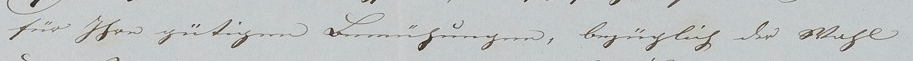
für Ihre gütigen Bemühungen, bezüglich der Wahl
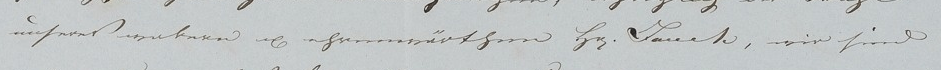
unseres wakern & ehrenwärthen Hr. Jauch, wir sind
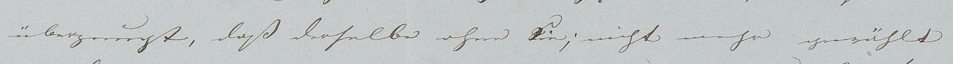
überzeugt, daß derselbe ohne Sie; nicht mehr gewählt
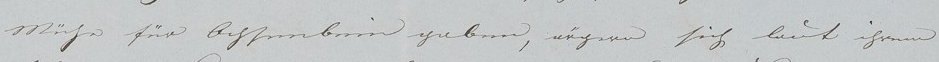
Mühe für Ochsenbein gaben, ärgern sich laut ihrem
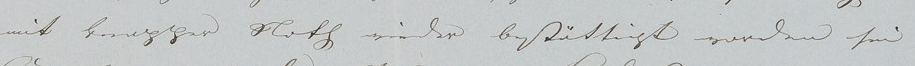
mit knapper Noth wieder bestättigt worden sei.
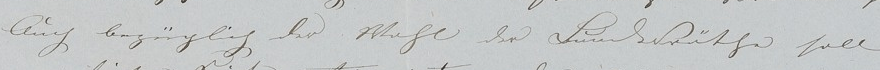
Auch bezüglich der Wahl der Bundesräthe soll
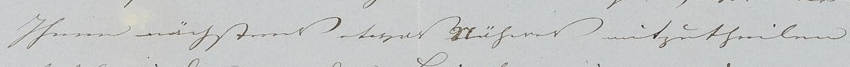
Ihnen nächstens etwas Näheres mitzutheilen
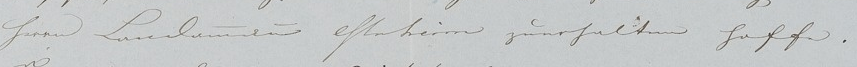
Herrn Landammann Muheim zuerhalten hoffe.
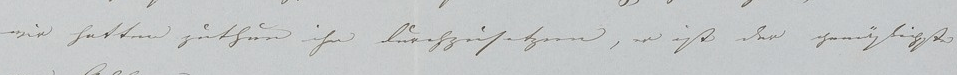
wir hatten zuthun ihn durchzusetzen, er ist der gemäßigste
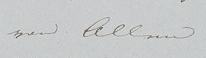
von Allen.»
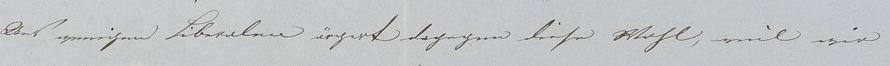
Uns wenigen Liberalen ärgert dagegen diese Wahl, weil wir
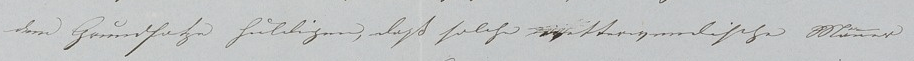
dem Grundsatze huldigen, daß solche wetterwendische Männer
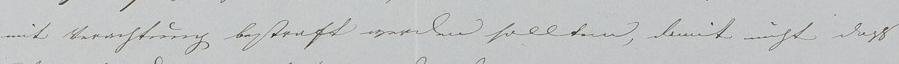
mit Verachtung bestraft werden sollten, damit nicht daß
